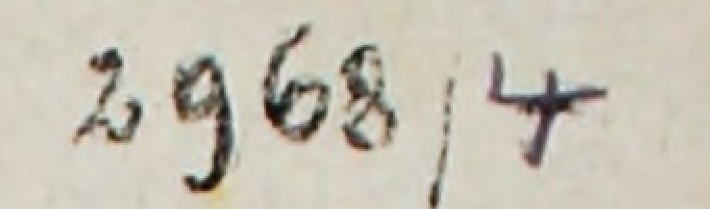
2968/4
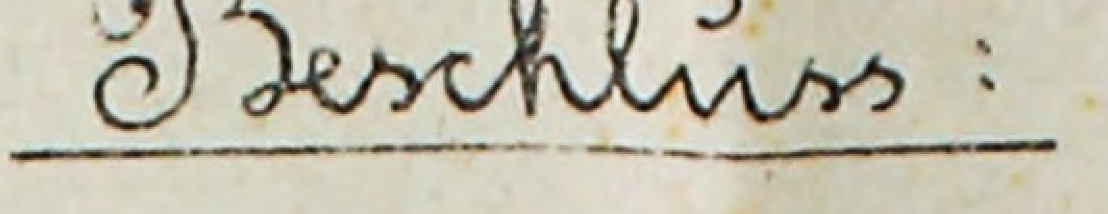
Beschluss:
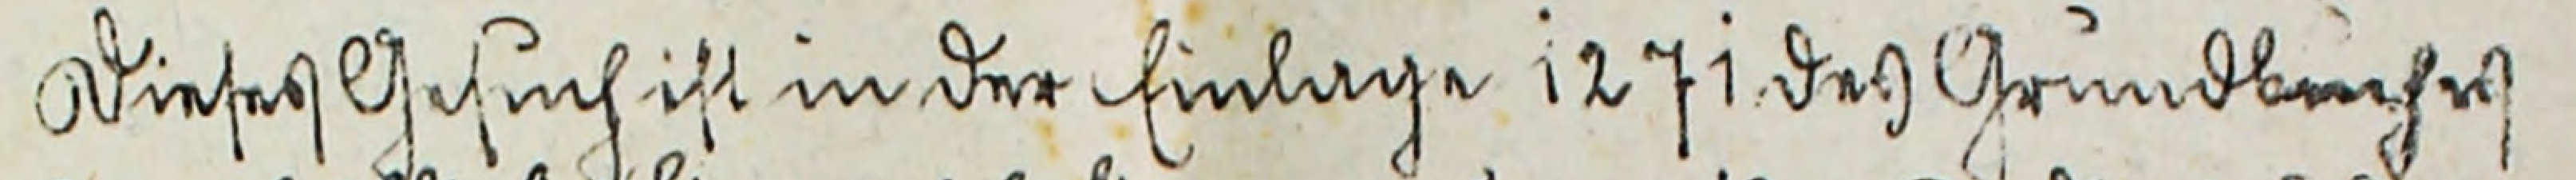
Dieses Gesuch ist in der Einlage 1271 des Grundbuches
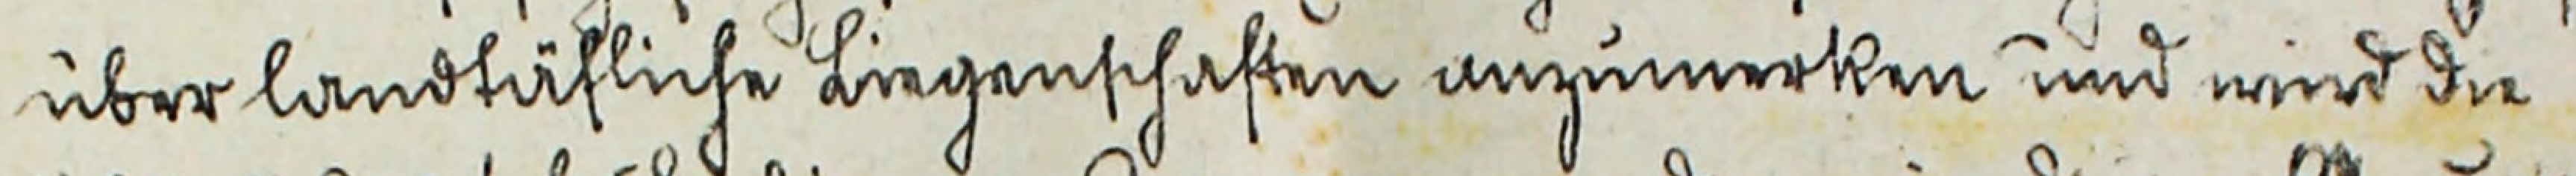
über landtäfliche Liegenschaften anzumerken und wird die
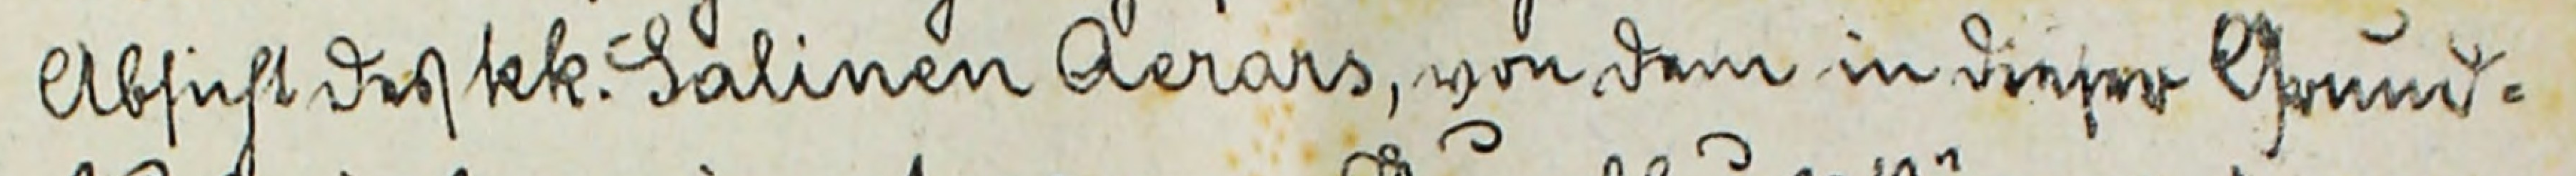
Absicht des kk. Salinen Aerars, von dem in dieser Grund=
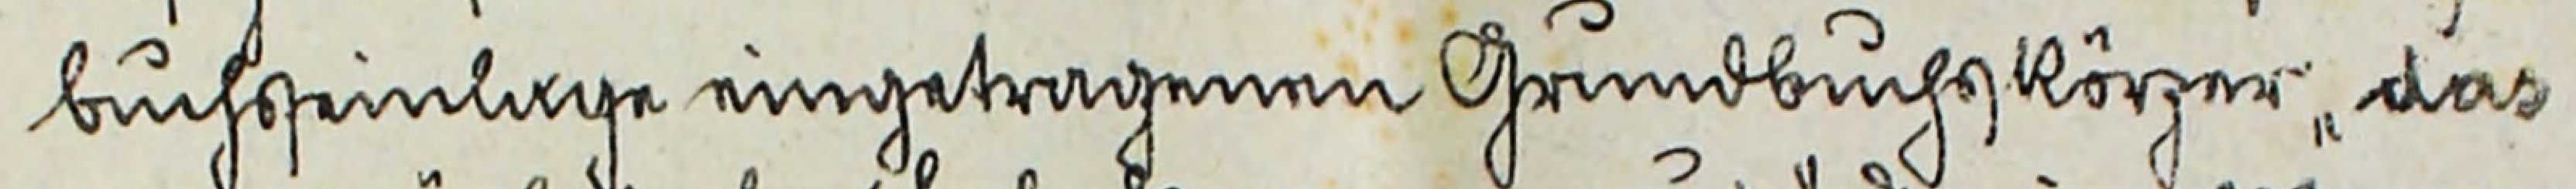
buchseinlage eingetragenen Grundbuchskörper „das
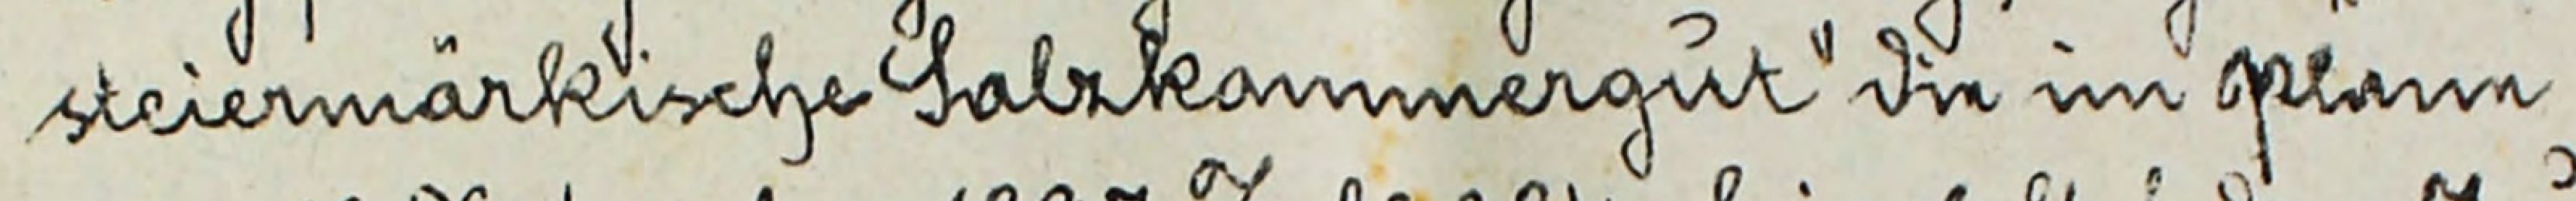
steiermärkische Salzkammergut“ die im Plane
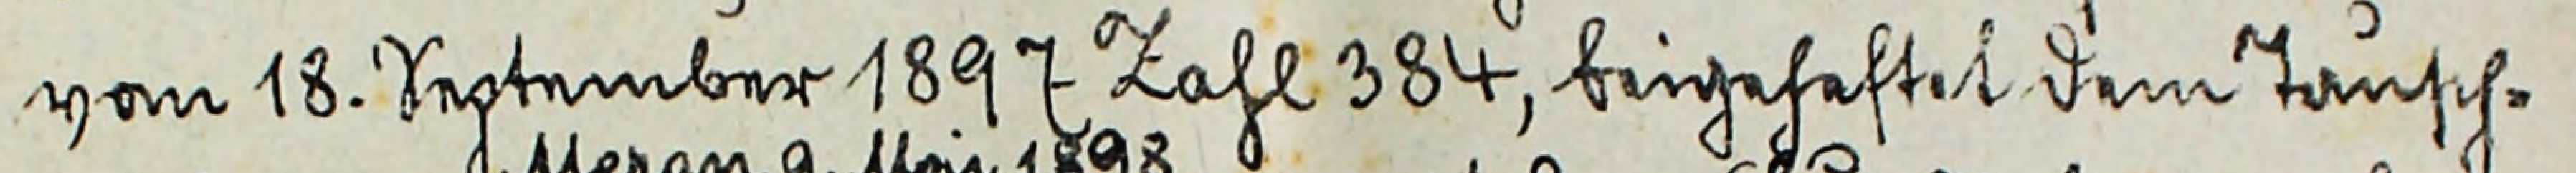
vom 18. September 1897 Zahl 384, beigehaftet dem Tausch=
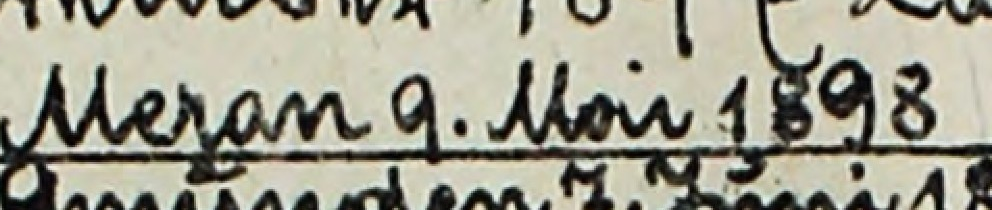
Megan 9. Mai 1898
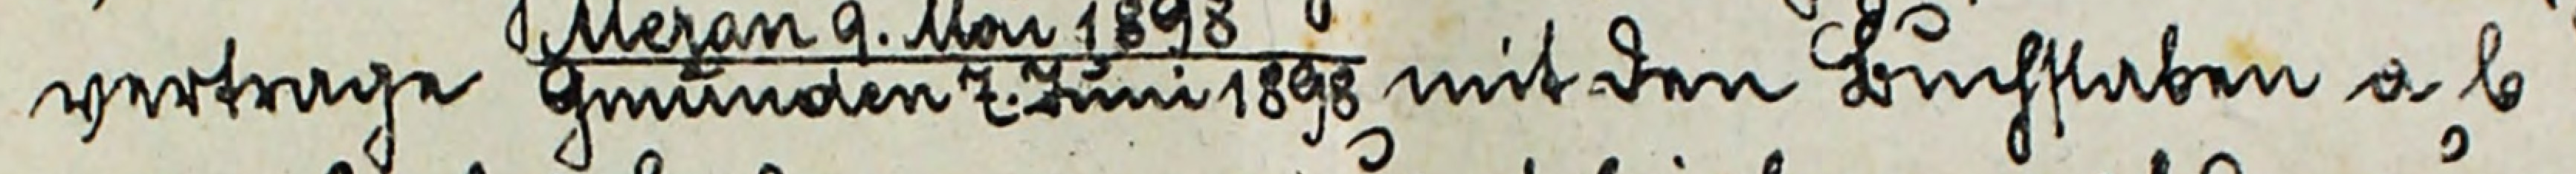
vertrage Gmunden 7. Juni 1898 mit den Buchstaben a b
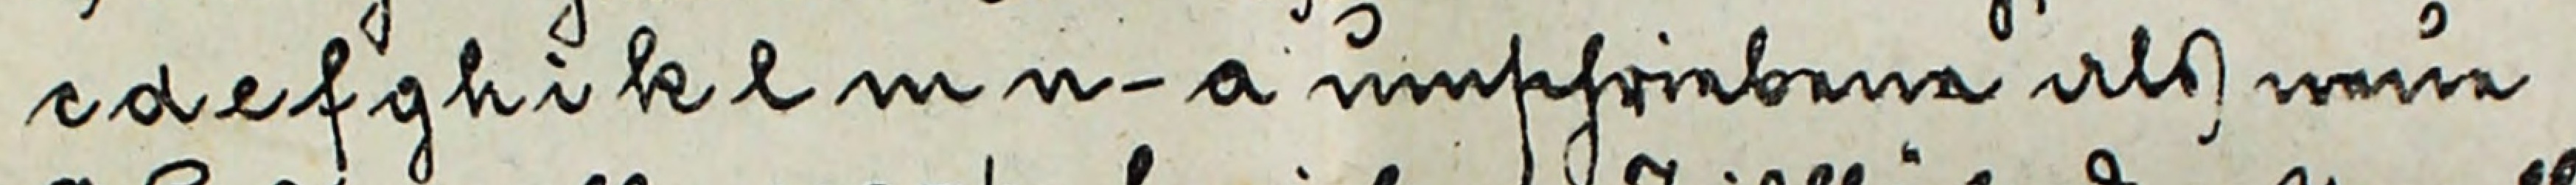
c d e f g h i k l m n - a umschriebene als ??ue
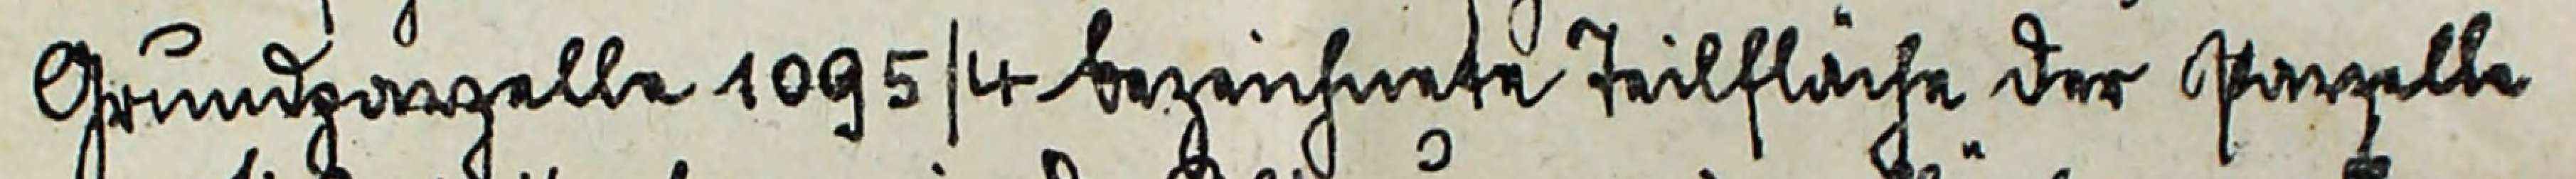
Grundparzalle 1095/4 bezeichnete Teilfläche der Parzelle
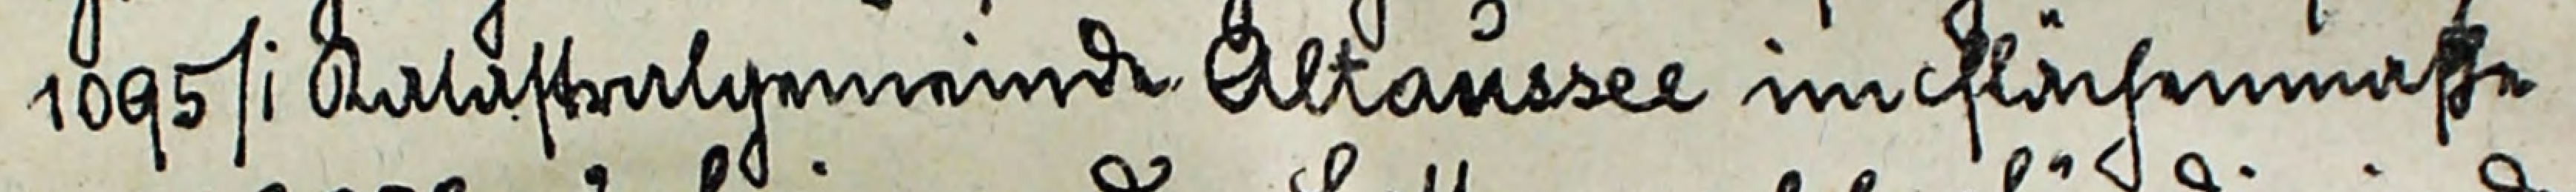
1095/i Katastralgemeinde Altaussee im Flächenmaße
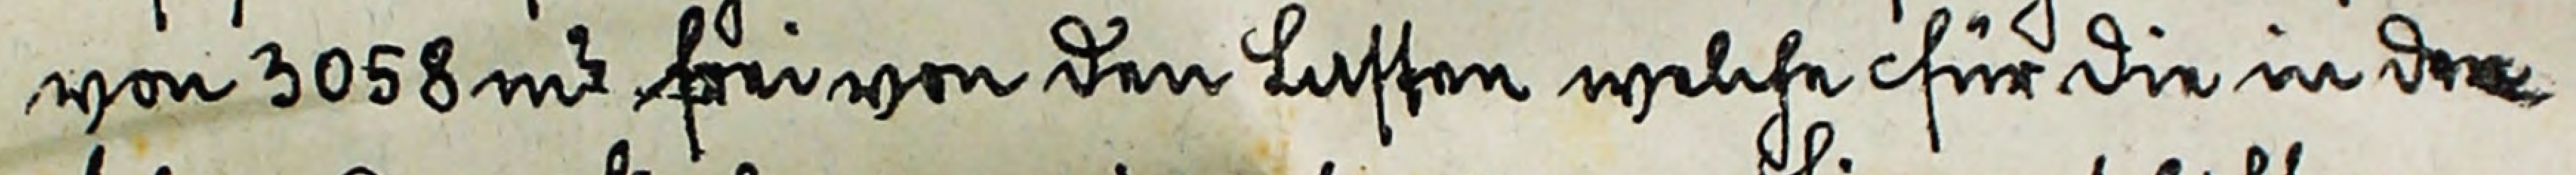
Von 3058 m2 frei von den Lasten welche für die in den
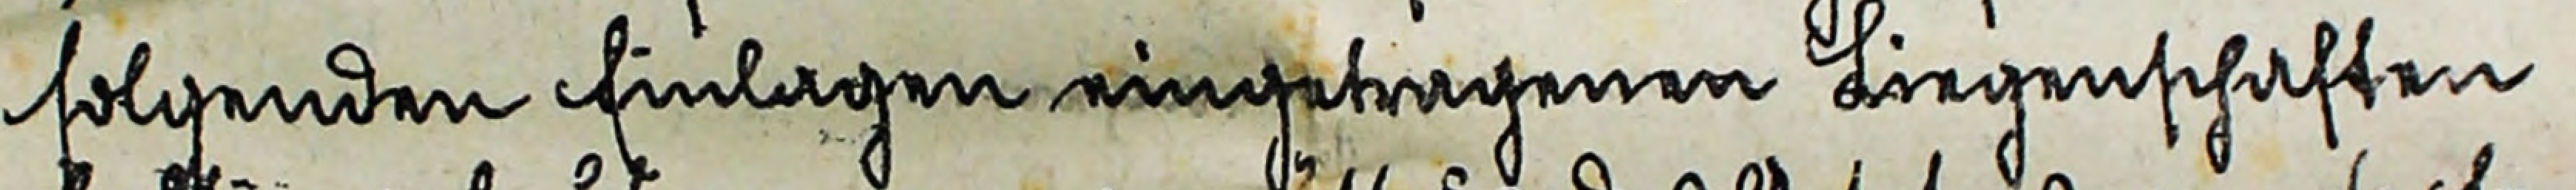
folgenden Einlagen eingetragenen Liegenschaften
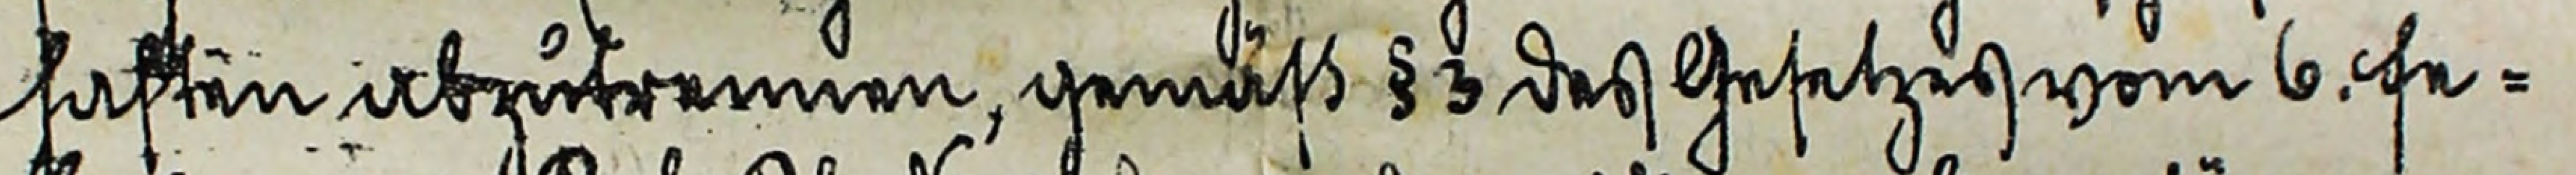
fasten abzutrennen, gemäß § 3 des Gesetzes vom 6. fe=
